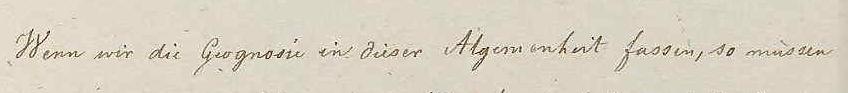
Wenn wir die Geognosie in dieser Algemeinheit fassen, so müssen
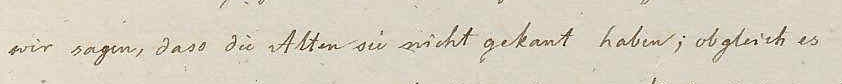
wir sagen, dass die Alten sie nicht gekant haben; obgleich es
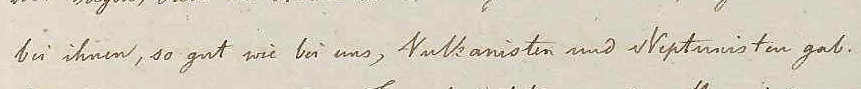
bei ihnen, so gut wie bei uns, Vulkanisten und Neptunisten gab.
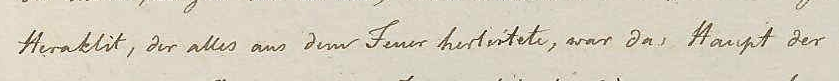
Heraklit, der alles aus dem Feuer herleitete, war das Haupt der
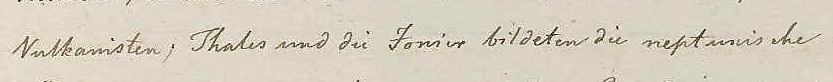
Vulkanisten, Thales und die Ionier bildeten die neptunische
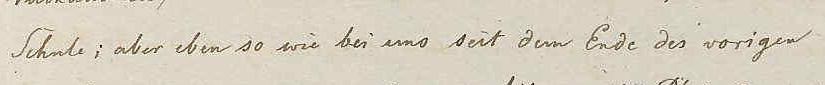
Schule; aber eben so wie bei uns seit dem Ende des vorigen
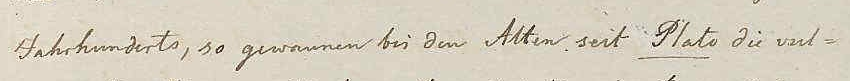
Jahrhunderts, so gewannen bei den Alten seit Plato die vul-
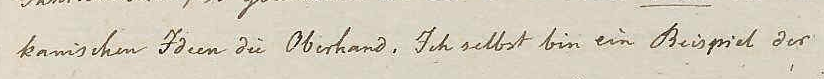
kanischen Ideen die Oberhand. Ich selbst bin ein Beispiel der
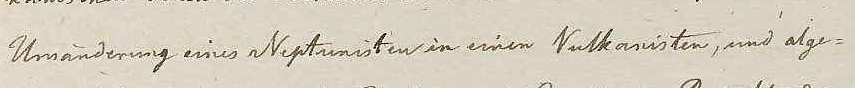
Umänderung eines Neptunisten in einen Vulkanisten, und alge-
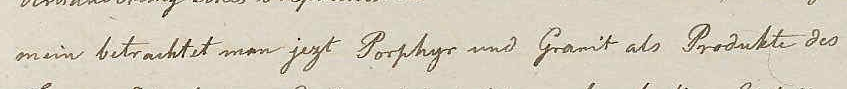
mein betrachtet man jezt Porphyr und Granit als Produkte des
